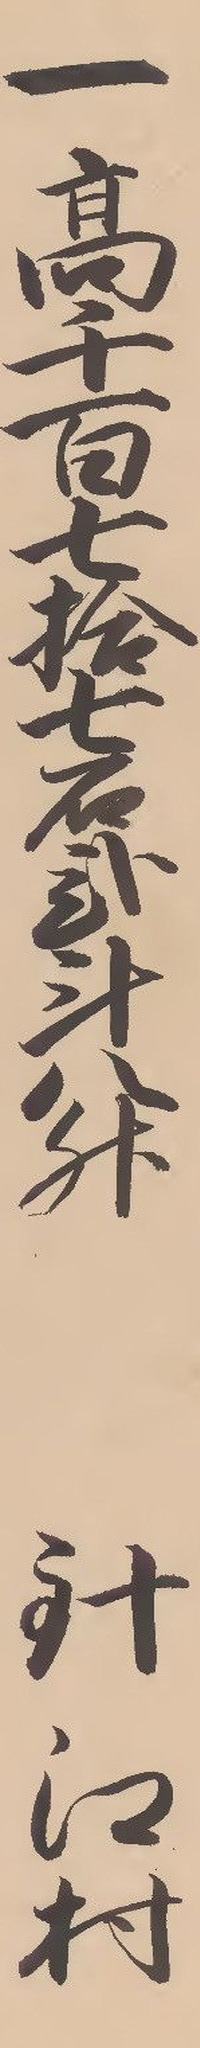一高千百七拾七石弐斗八升針江村
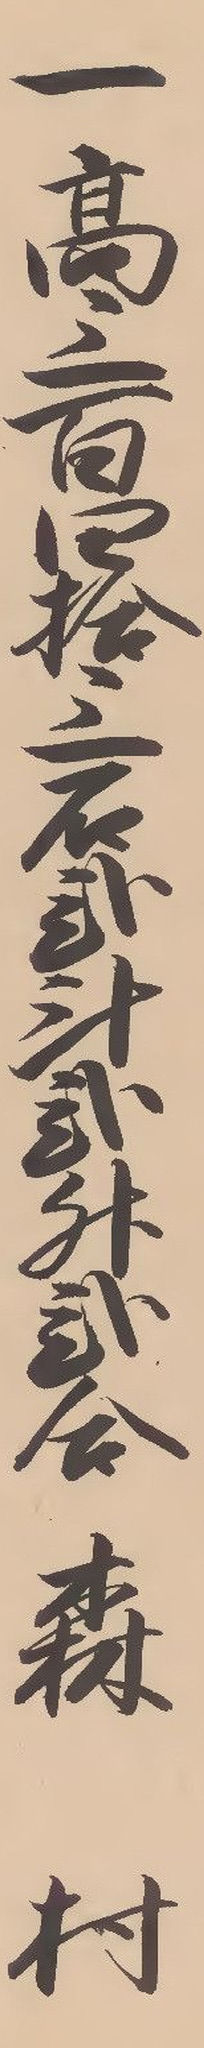一高三百四拾三石弐斗弐升弐合森村
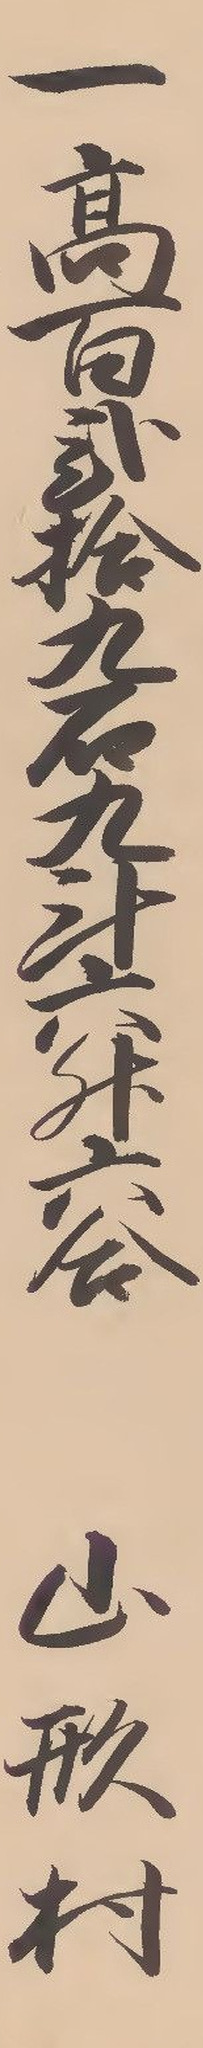一高百弐拾九石九斗六升六合山形村

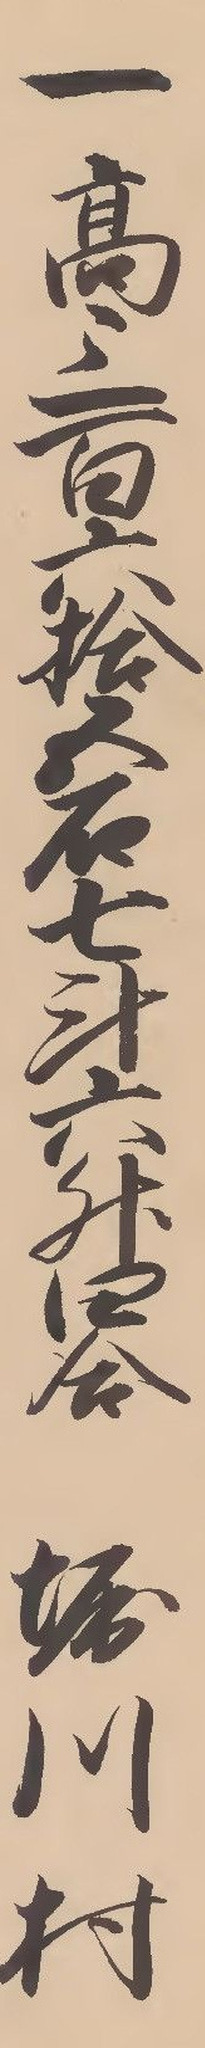一高三百六拾五石七斗六升四合堀川村
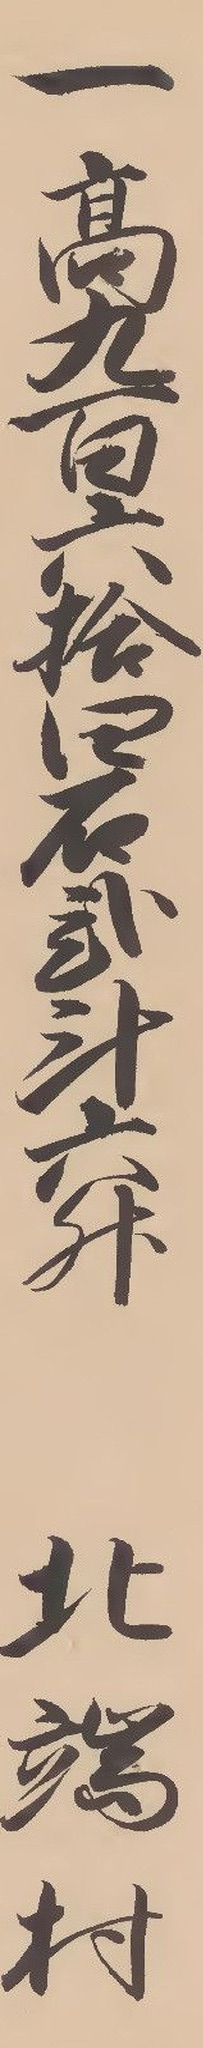一高九百六拾四石弐斗六升北端村
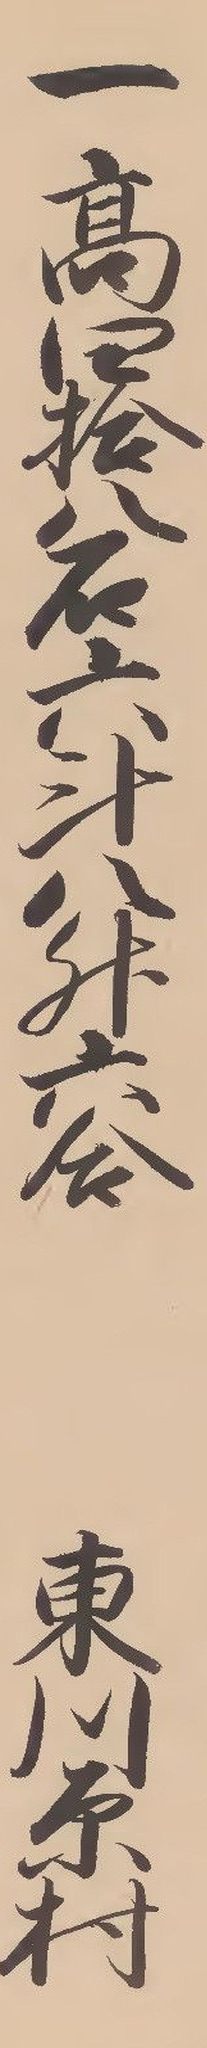一高四拾八石六斗八升六合東川原村
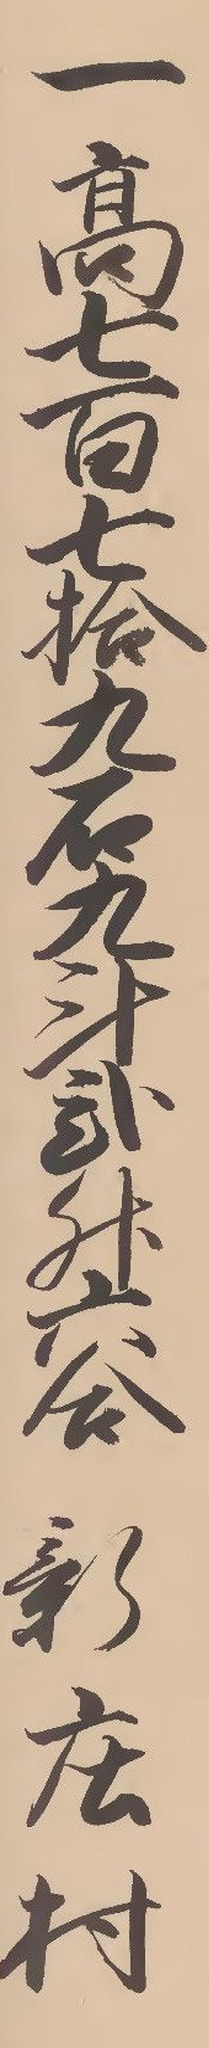一高七百七拾九石九斗弐升六合新庄村
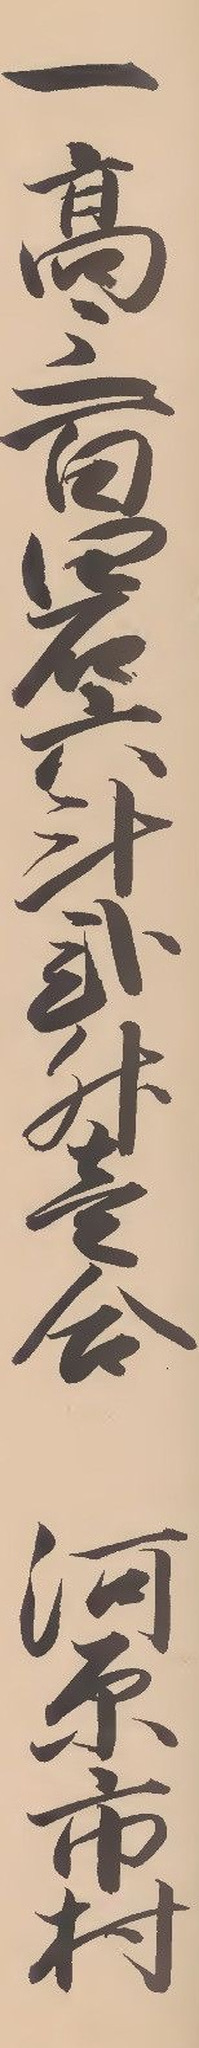一高三百四石六斗弐升壱合河原市村
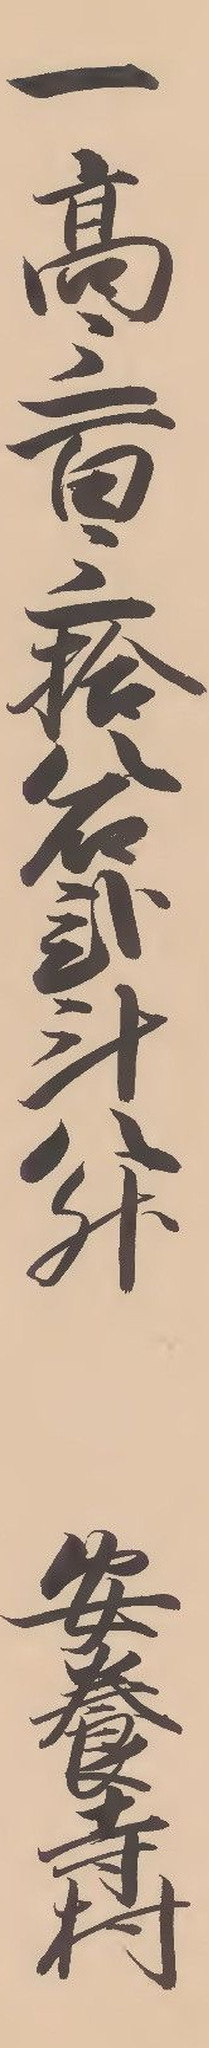一高三百三拾八石弐斗八升安養寺村
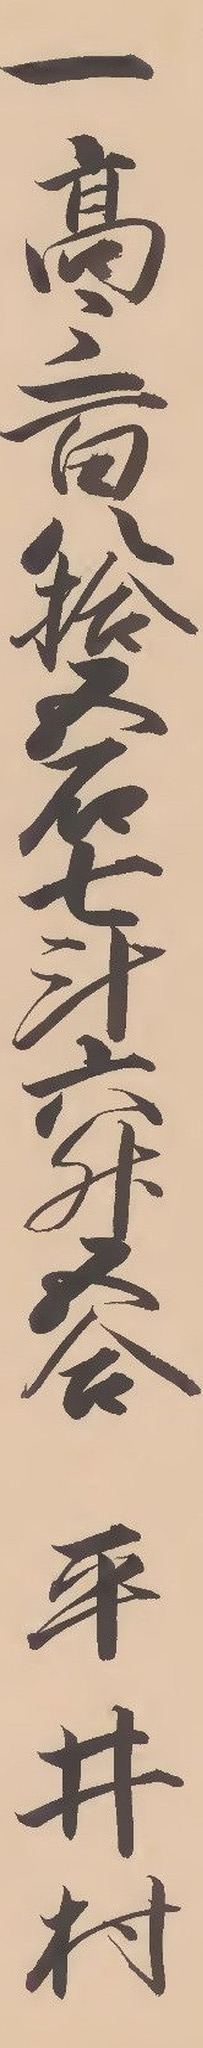一高三百八拾五石七斗六升五合平井村
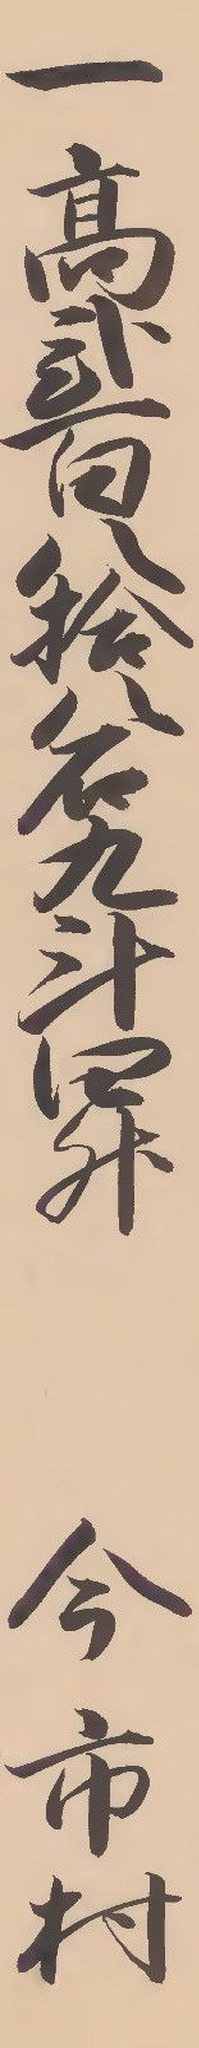一高弐百八拾八石九斗四升今市村

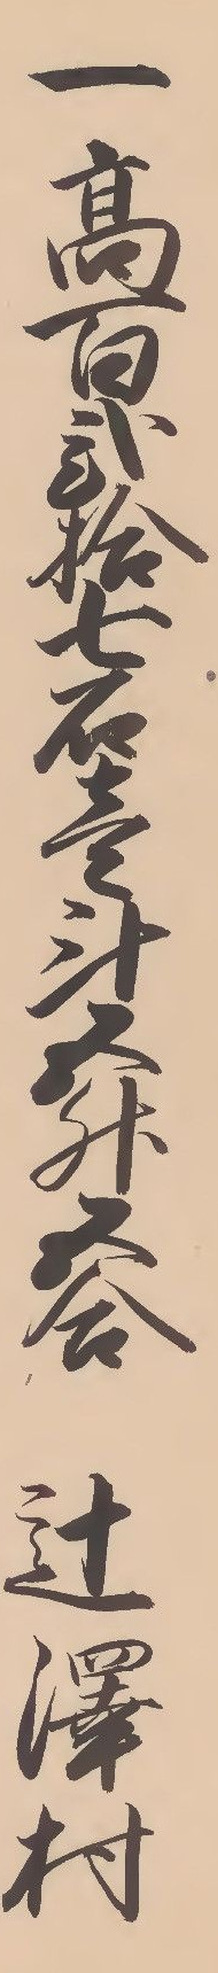一高百弐拾七石壱斗五升五合辻沢村
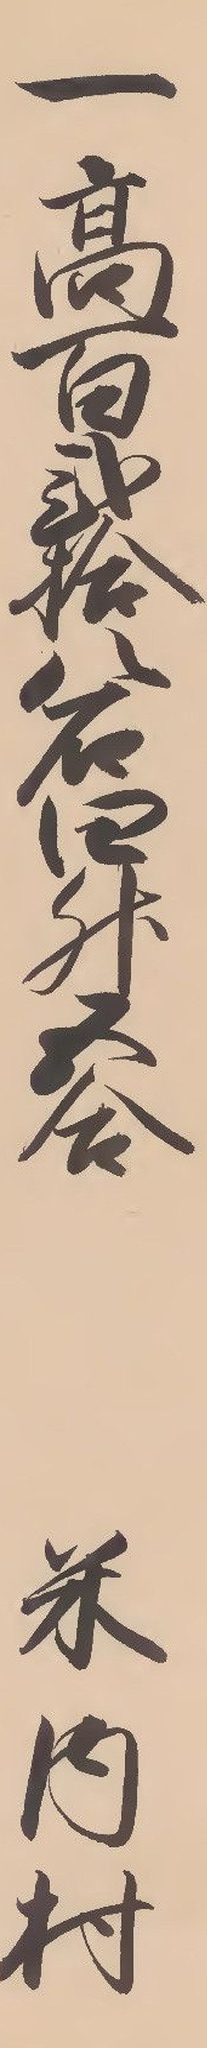一高百弐拾八石四升五合米内村
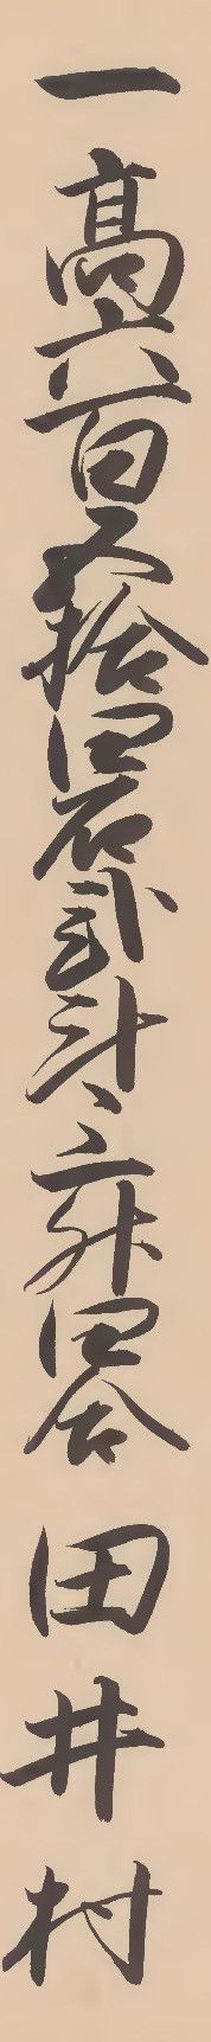一高六百五拾四石弐斗三升四合田井村
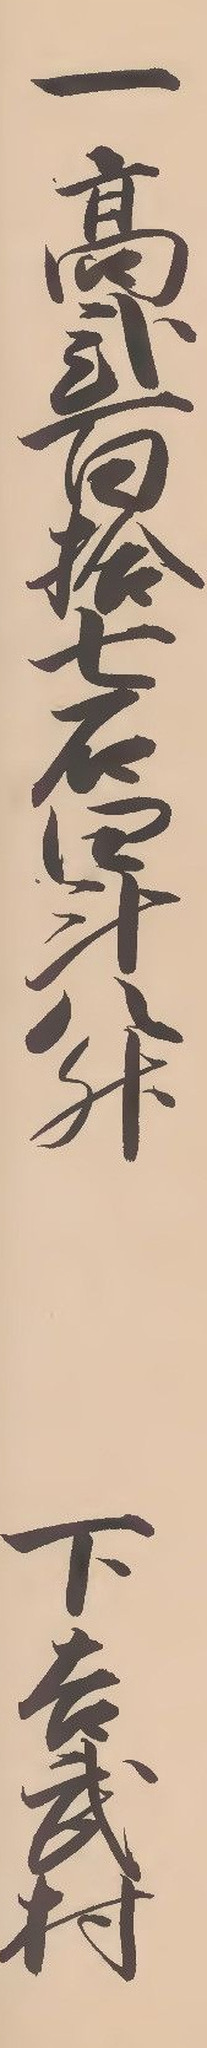一高弐百拾七石四斗八升下吉武村
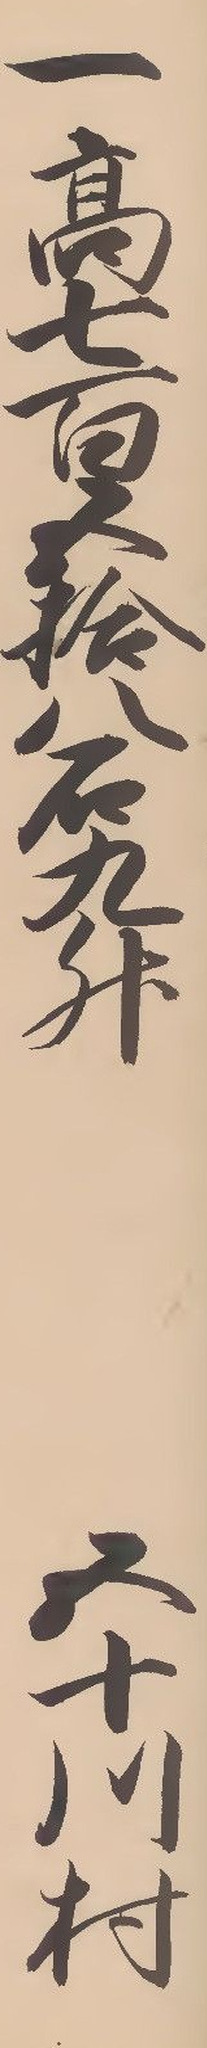一高七百五拾八石九升五十川村
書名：近江国郷帳
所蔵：国立公文書館 National Archives of Japan
